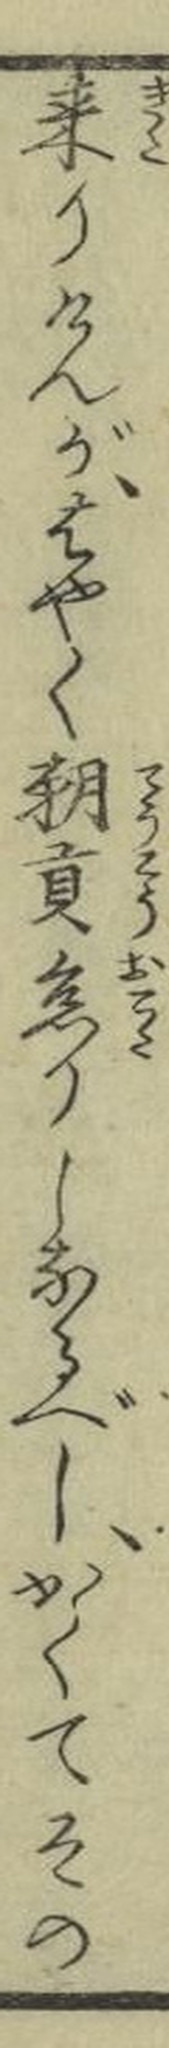来りけんが、はやく朝貢怠りしなるべし、かくてその

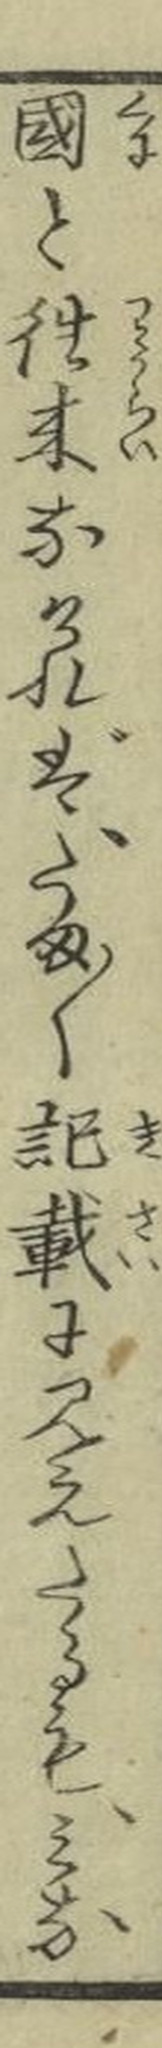国と往来なければ、たま〳〵記載に見えたるも、みな
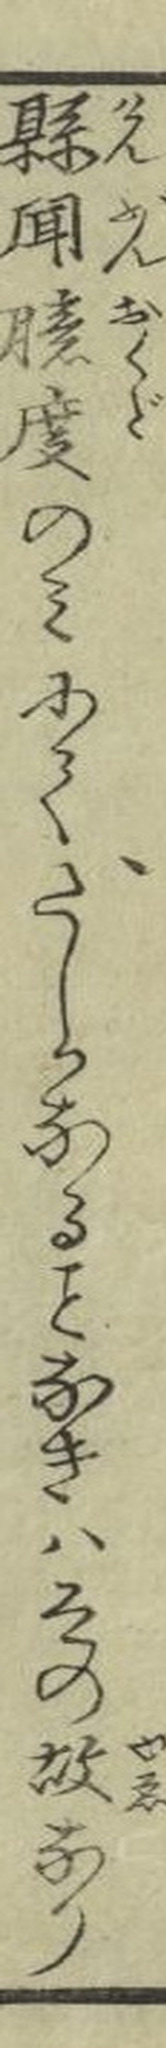県聞臆度のみにて、たしかなることなきはその故なり
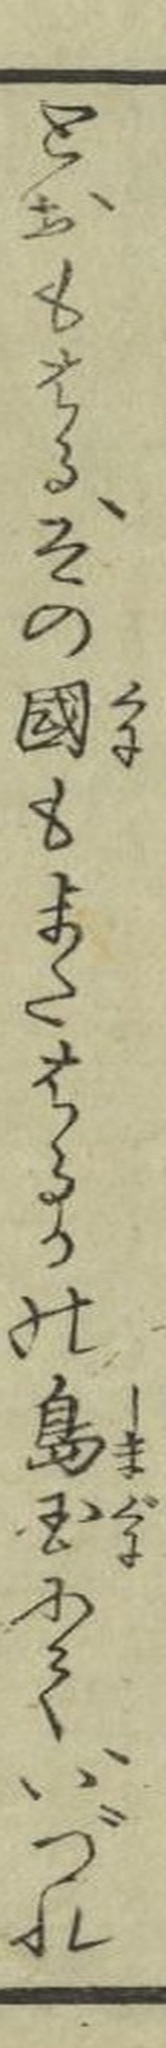とおもはる、その国もまたはるかの島国にて、いづれ
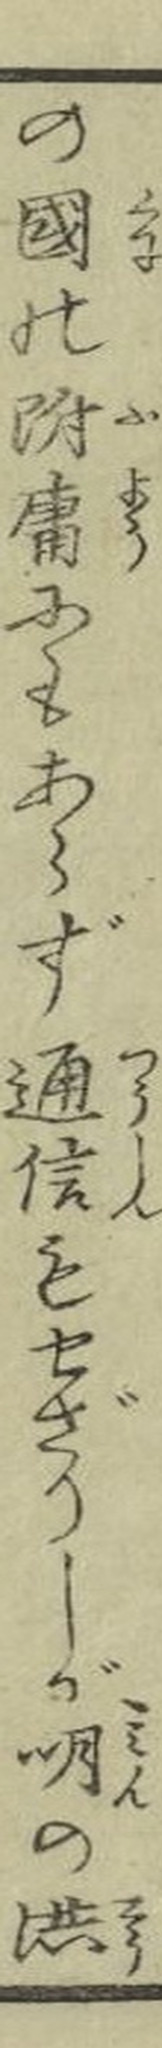の国の附庸にもあらず通信もせざりしが、明の洪
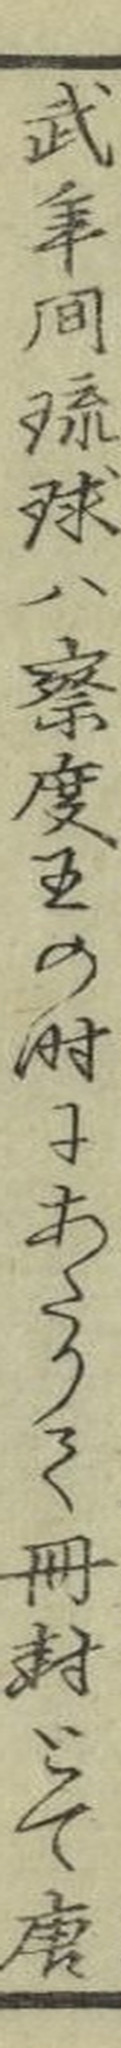武年間、琉球は察度王の時にあたりて冊封とて唐
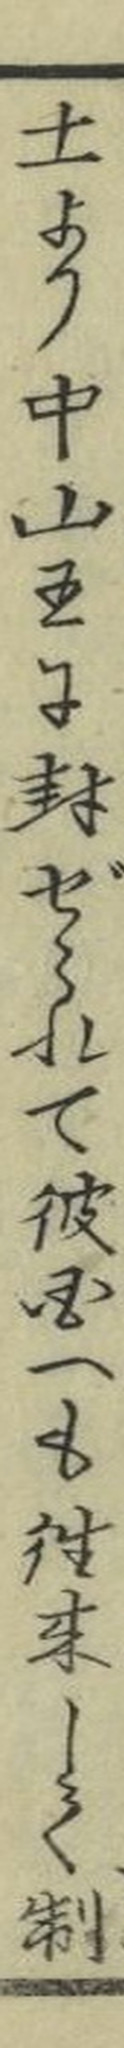土より中山王に封ぜられて、彼国へも往来して、制
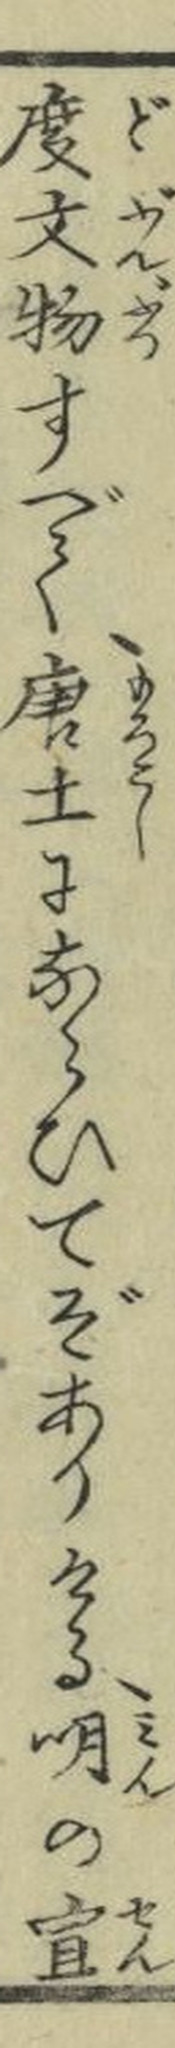度文物すべて、唐土にならひてぞありける、明の宣
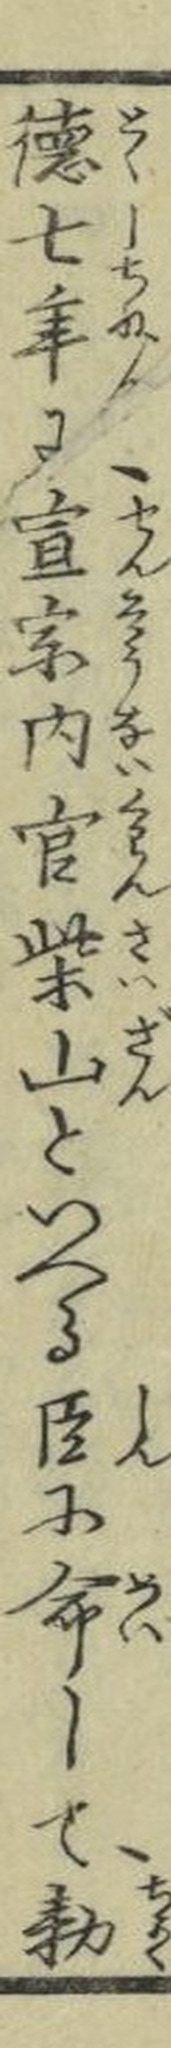徳七年に、宣宗内官紫山といへる臣に命して、勅
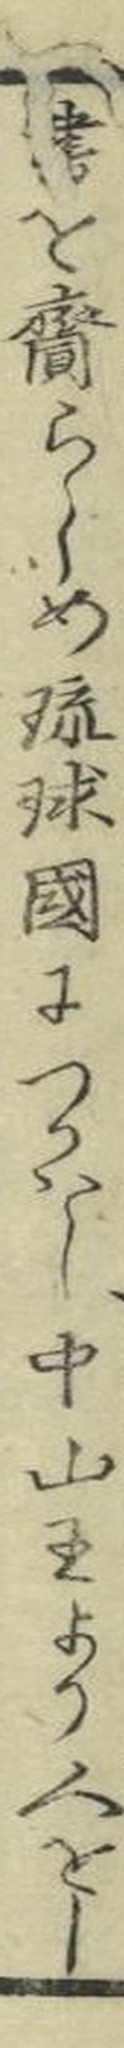書を齎らしめ琉球国につかはし、中山王より人をし
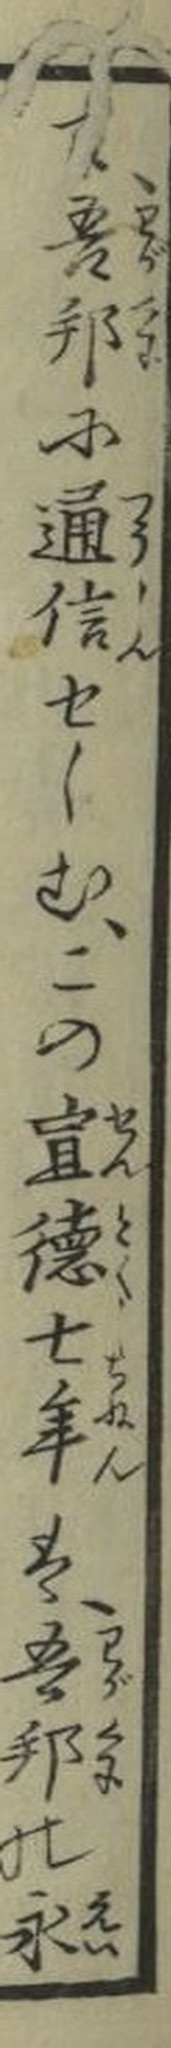て、吾邦に通信せしむ、この宣徳七年は、吾邦の永
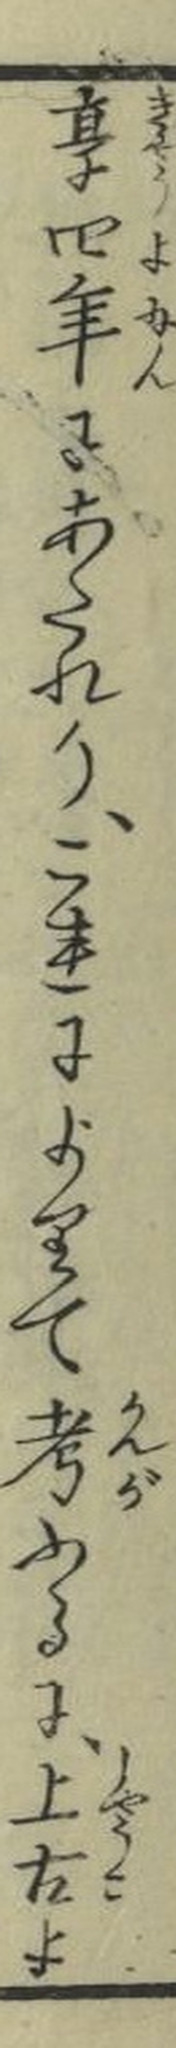享四年にあたれり、これによりて考ふるに、上古よ
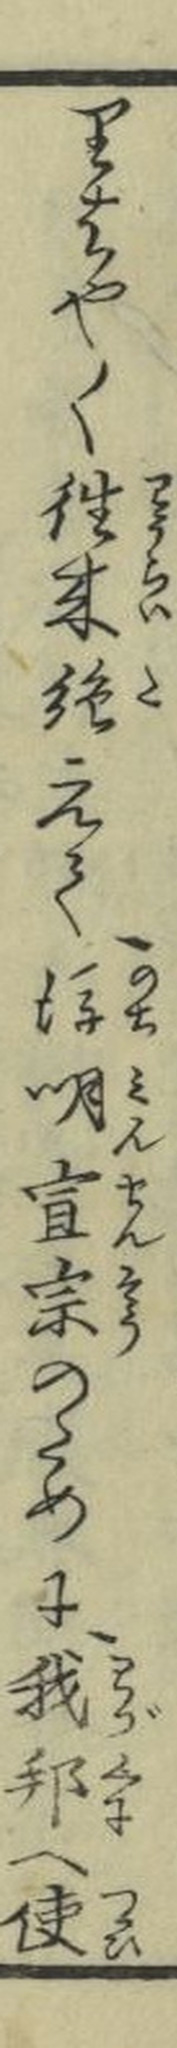りはやく往来絶えて、後明宣宗のために、我邦へ使
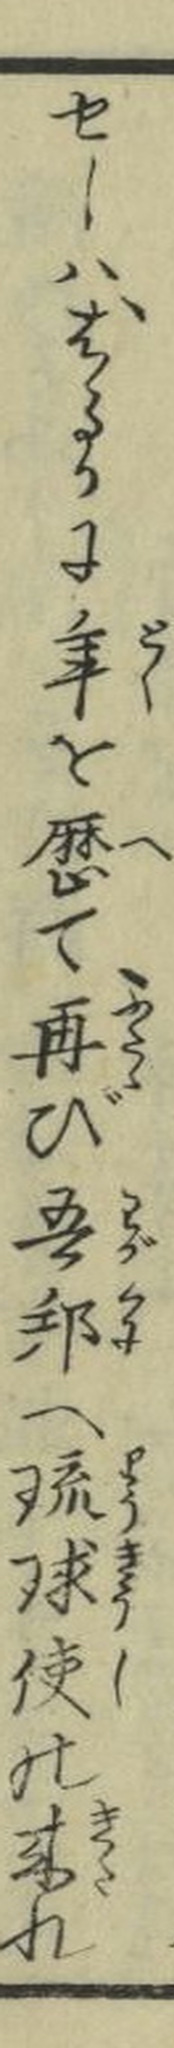せしは、はるかに年を歴て、再び吾邦へ琉球使の来れ
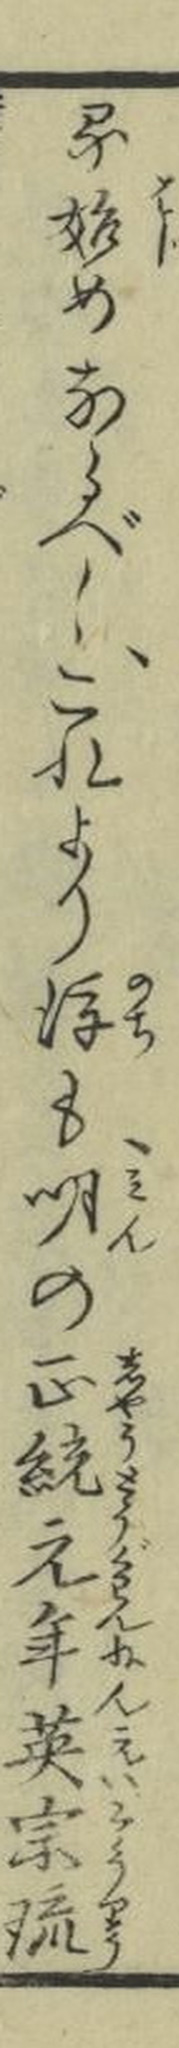る始めなるべし、これより後も、明の正統元年英宗琉
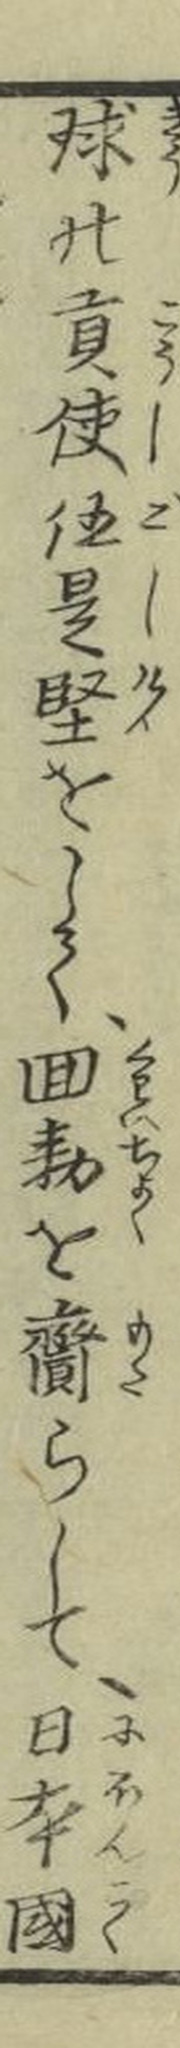球の貢使伍是堅をして、回勅を齎らして、日本国
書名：琉球入貢紀略
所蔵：University of the Ryukyus Library
